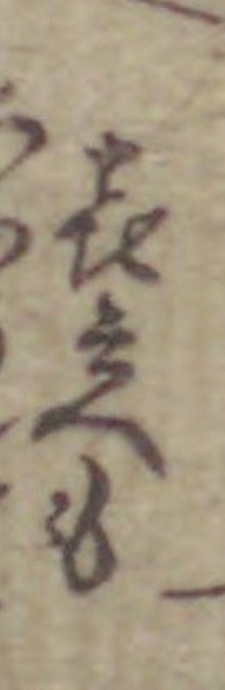喜兵へも
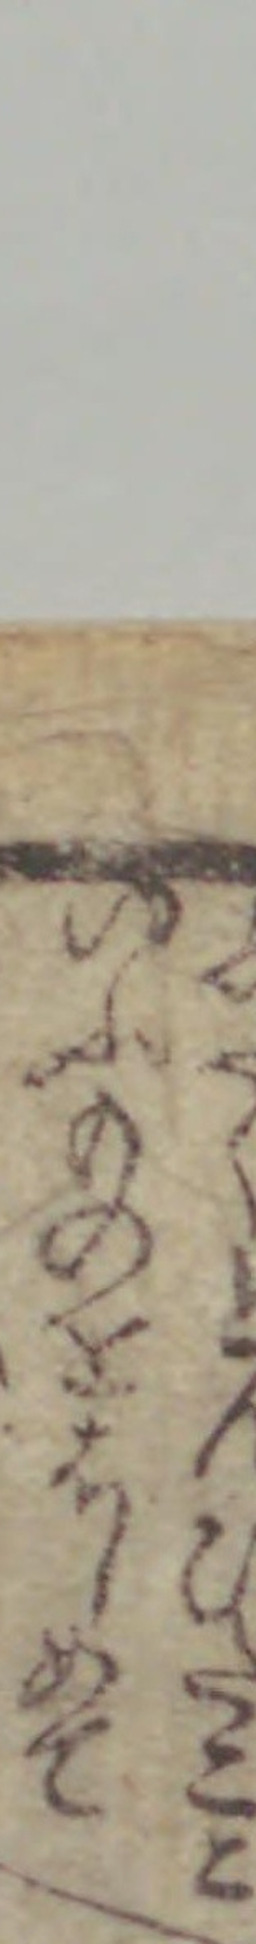いふものをはしめて
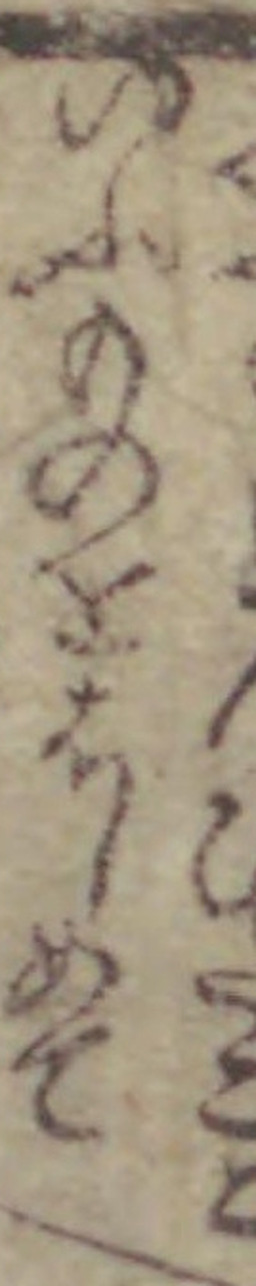いふものをはしめて
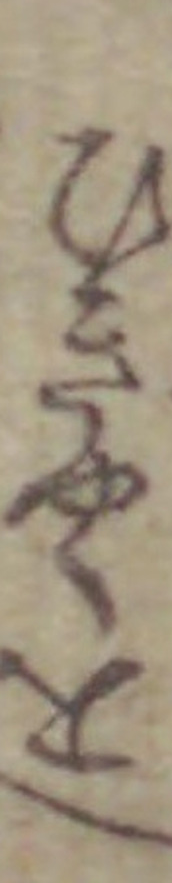ひきやくを
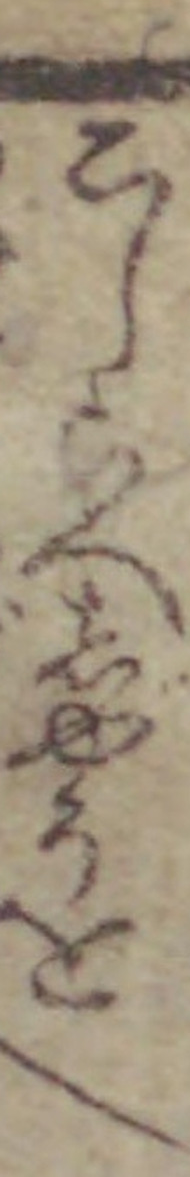こしらへじやうを
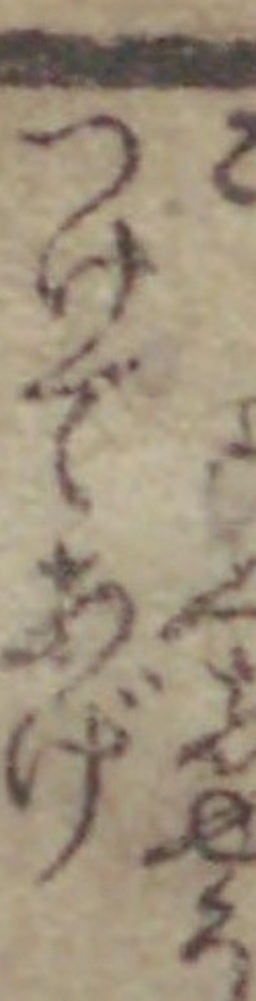つけてあげ
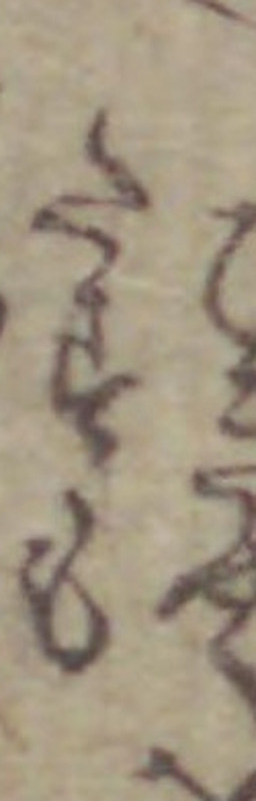たすも
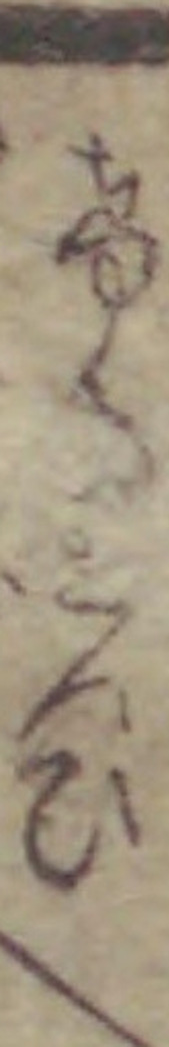けんとんひ
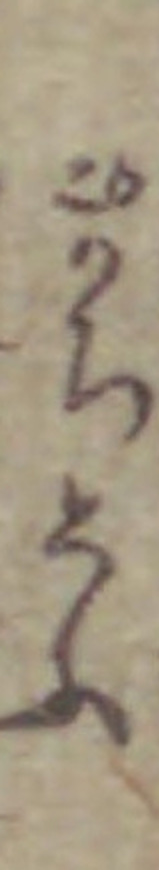まちとふ
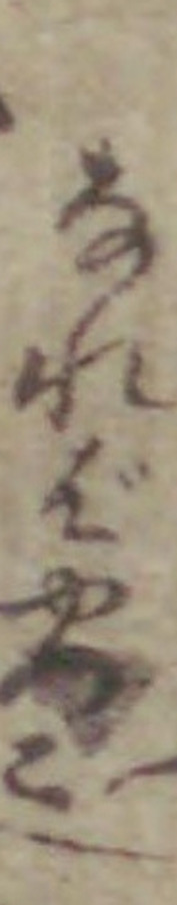なればやつこ
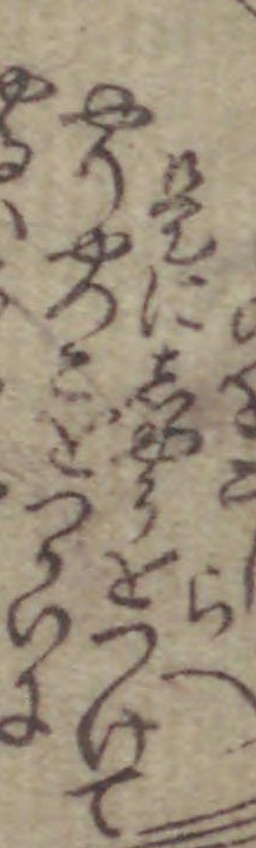やりやつこをつかいに
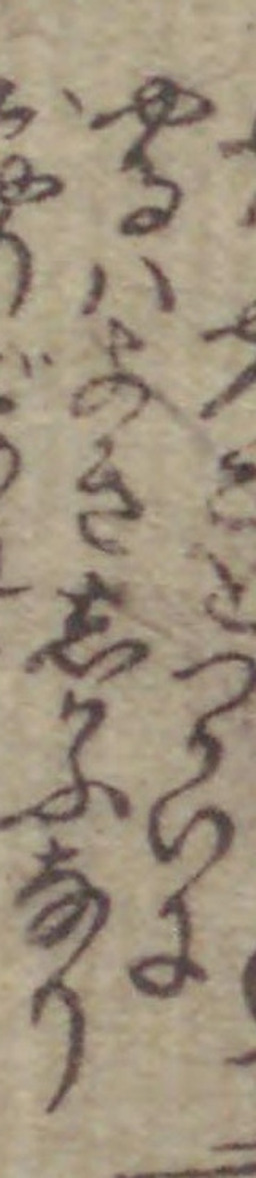やるはよきしかふなり

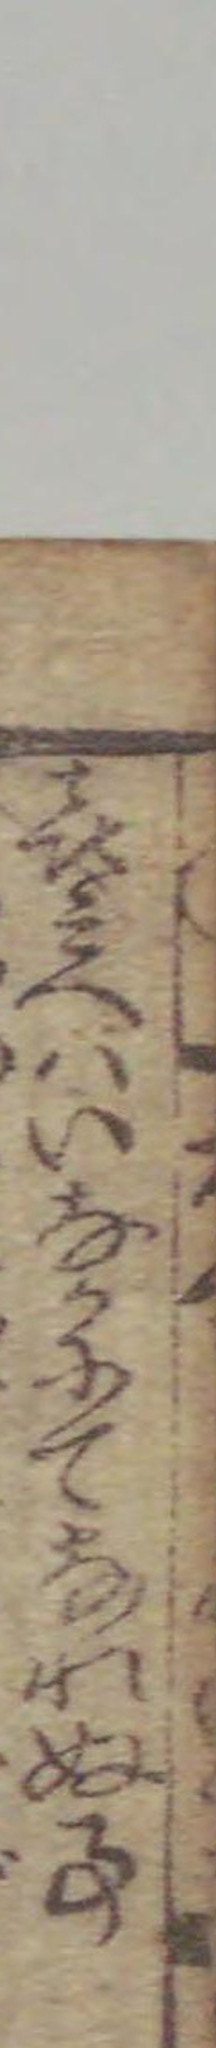喜兵へはいなかにてなれぬ事
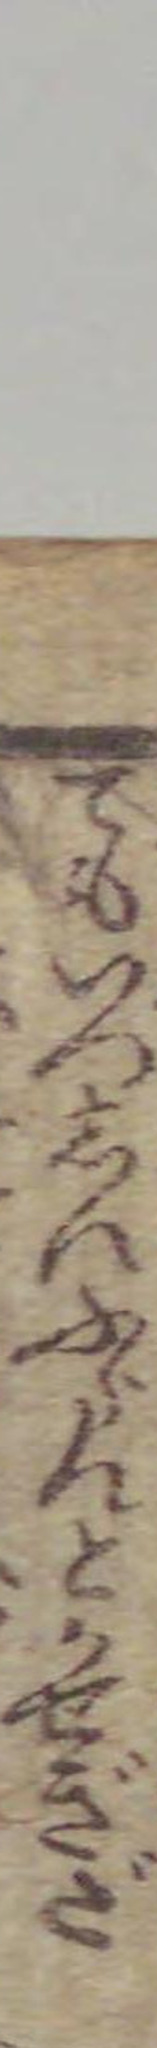てもいつしんふらんとかせぎだ
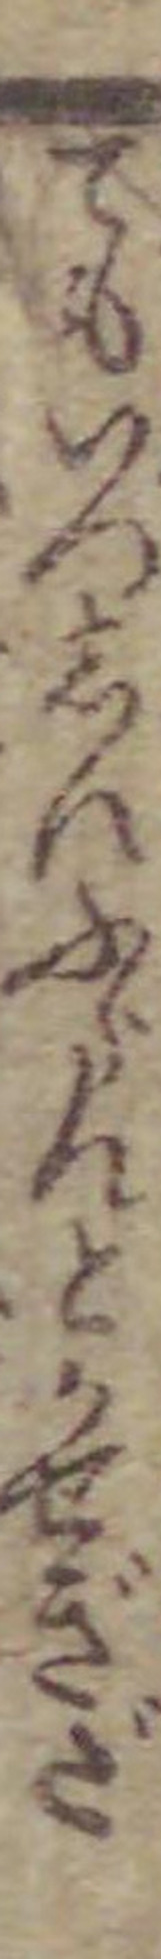てもいつしんふらんとかせぎだ
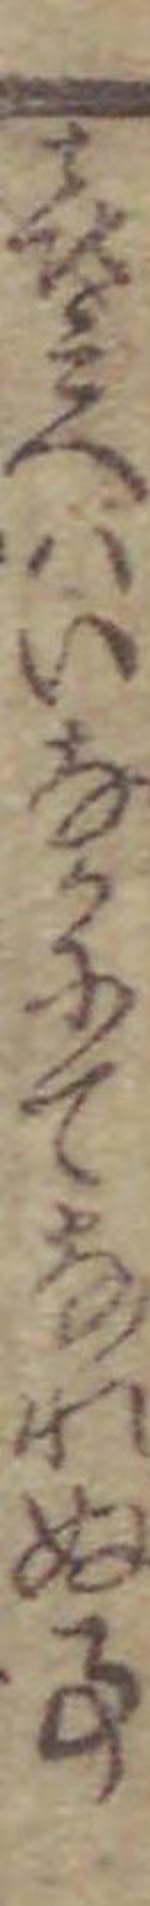喜兵へはいなかにてなれぬ事
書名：親父布子鳶握 3巻
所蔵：国立国会図書館 National Diet Library, JAPAN
